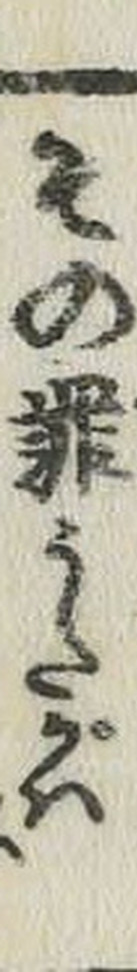その罪うたがは
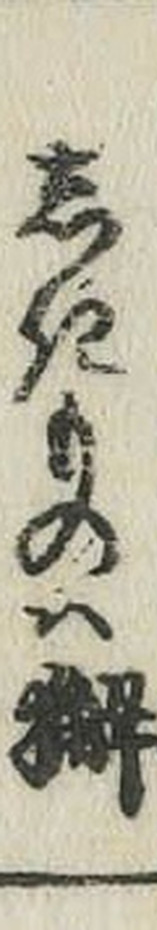しきものは獬
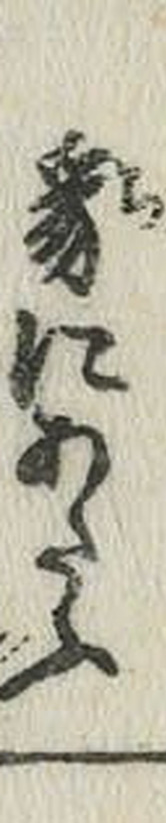豸にあたふ
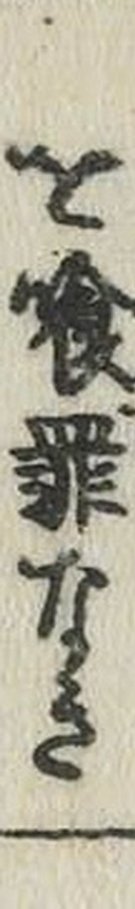を喰罪なき
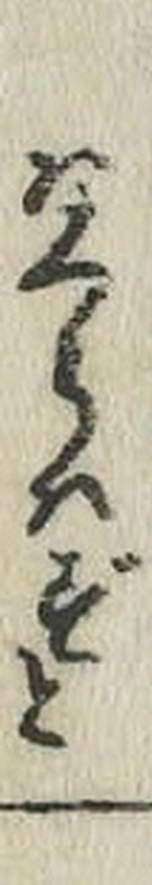はくらはずと

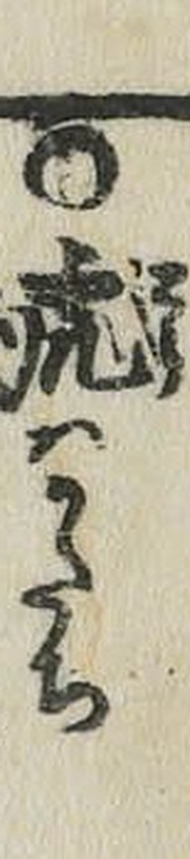○虎はかたち
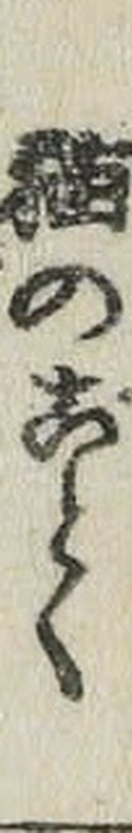猫のごとく
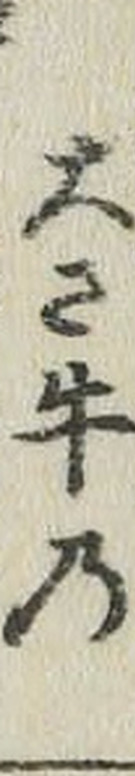大さ牛の
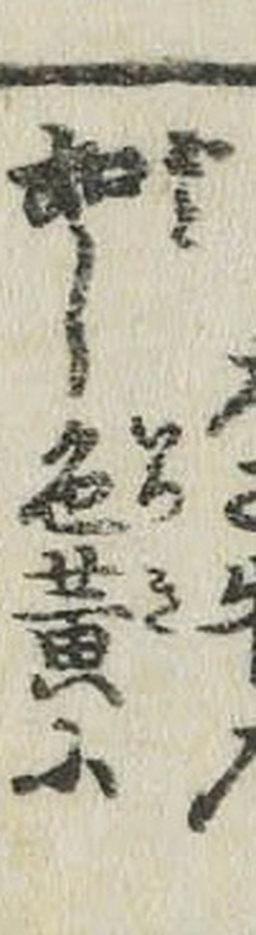如し色黄に
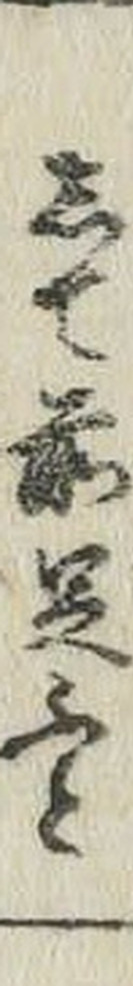して前足ふと
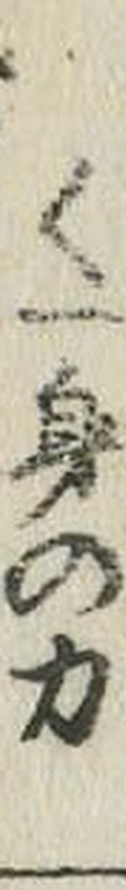く一身の力
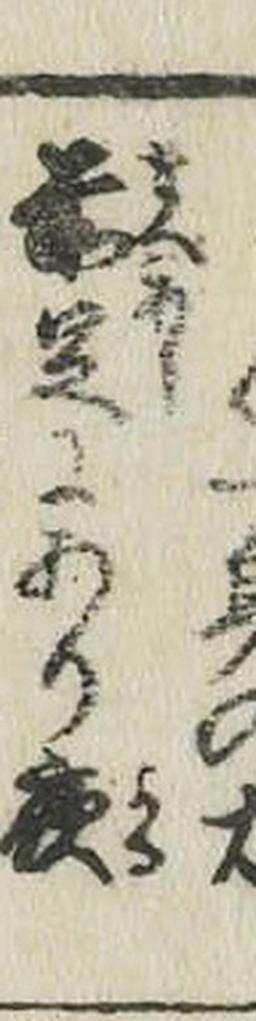前足にあり夜
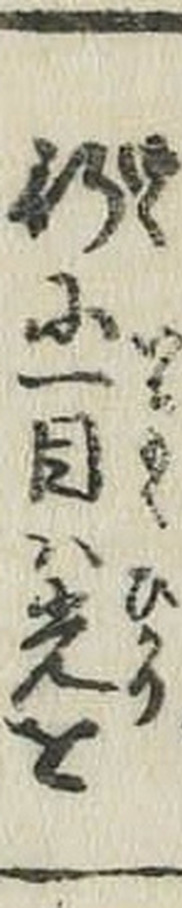行に一目は光を
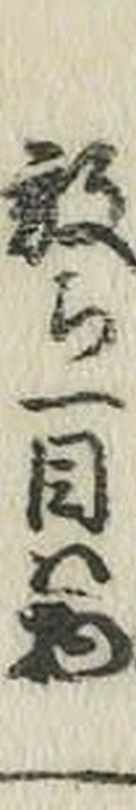放ち一目は物
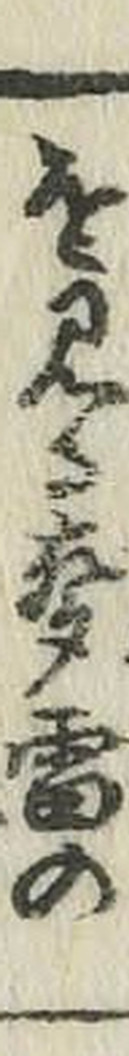を見る声雷の
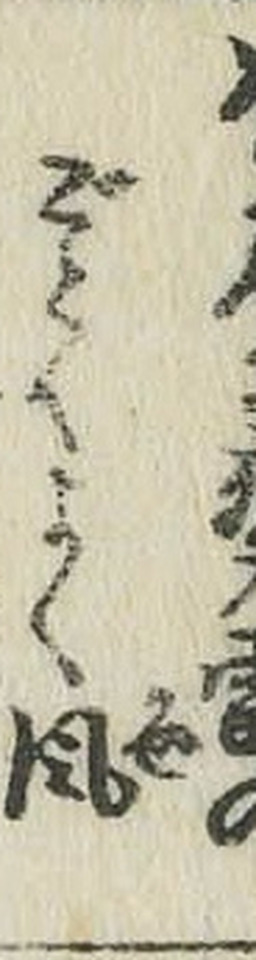ごとくよく風
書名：増補頭書訓蒙図彙大成 10巻 6:巻之12-13
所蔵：東京学芸大学教育コンテンツアーカイブ
